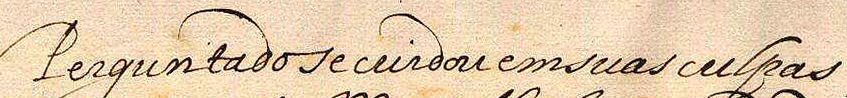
Perguntado se cuidou em suas culpas
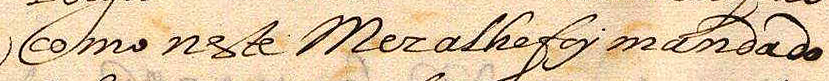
como neste Meza lhe foy mandado
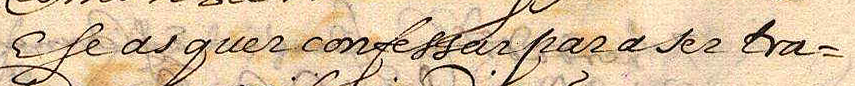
E se as quer confessar para ser tra
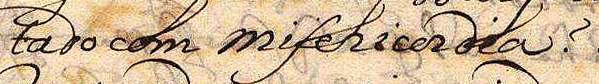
tado com misericordia?
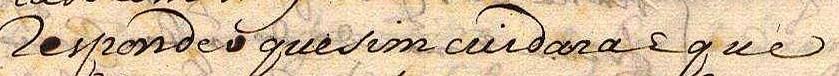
Respondeo que sim cuidara E que
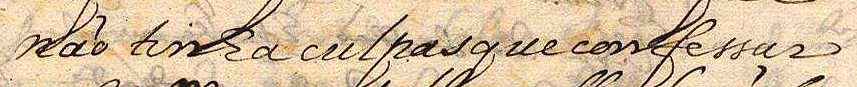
naõ tinha culpas que confessar
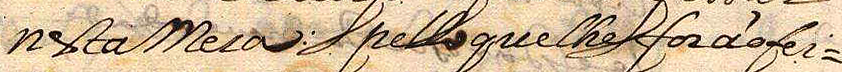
nesta Mesa: pello que lhe foraõ fei
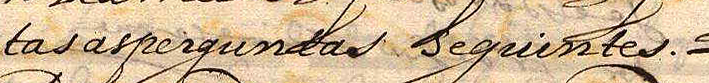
tas as perguntas seguintes.
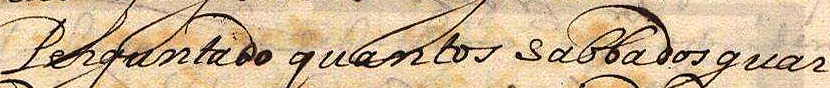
Perguntado quantos sabbados guar
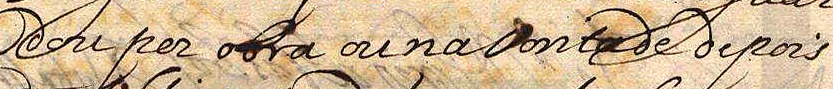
dou per obra ou na vontade depois
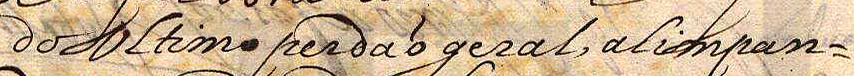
do vltimo perdaõ geral, alimpan
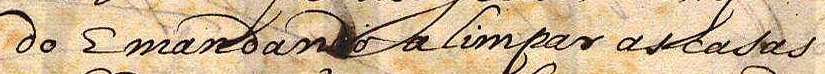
do E mandando alimpar as casas
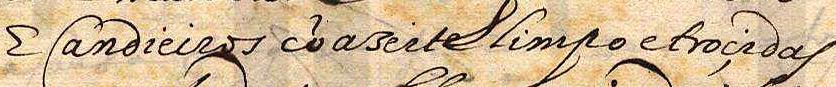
E Candieiros cō azeite limpo e troçidas
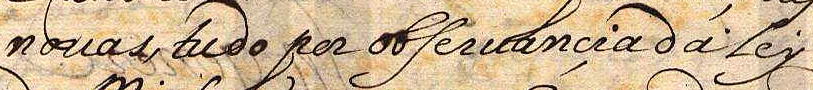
nouas, tudo por obseruançia da Ley
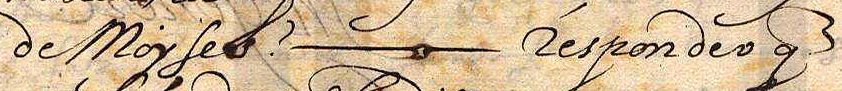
de Moyses? - respondeo q̄
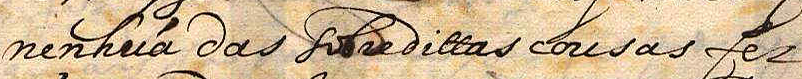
nenhuā das sobredittas cousas fez
